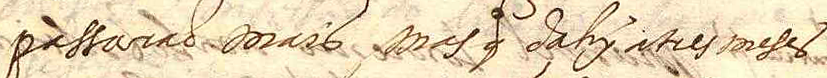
passaraõ mais, mas q̄ dahy a tres meses
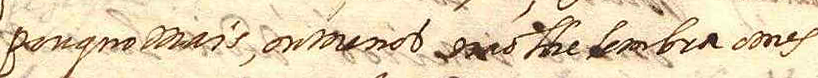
pouquo mais, ou menos naõ lhe lembra o mes
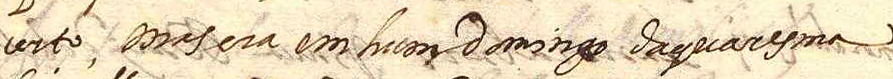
certo, mas era em hum domingo da quaresma
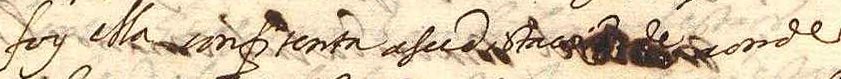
foy ella confitenta a see desta ci__de aonde
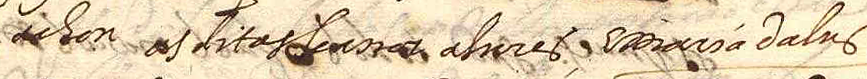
achou as ditas Leanor alures, E maria da lus
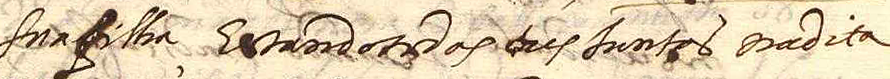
sua filha E estando todas tres Juntas na dita
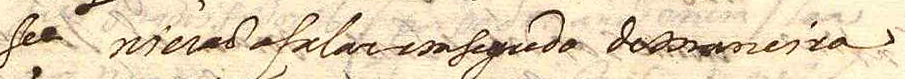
see uieraõ a falar em segredo de maneira
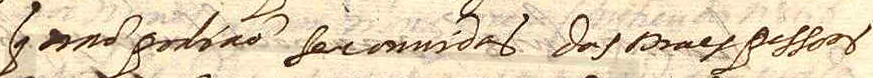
q̄ o nõ podraõ ser ouuidas das maes pessoas
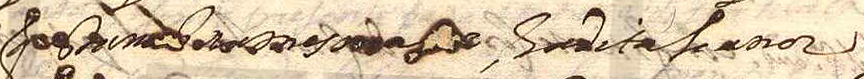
q̄ estauaõ na mesma _e, E a dita Leanor
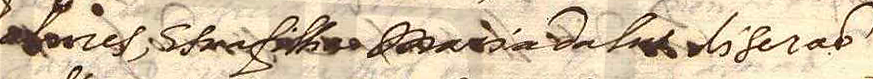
alures, E sua filha Maria da lus diseraõ
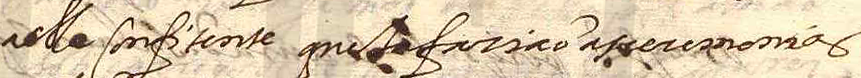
a ella Confitente que la faziaõ as ceremonias
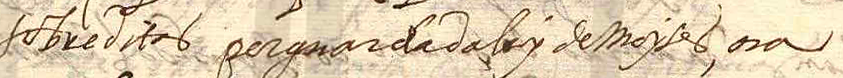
sobreditas per guarda da ley de Moyses, na
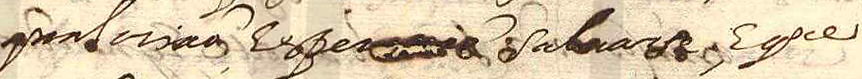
qual criaõ, E esper___ saluarse, E que
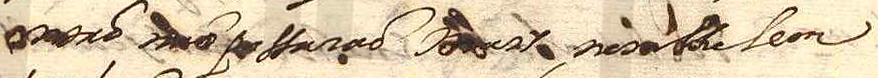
_ntaõ naõ passaraõ mais, nem lhe lem
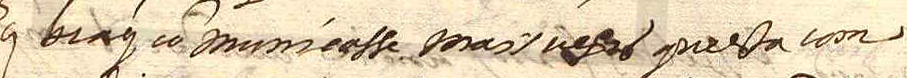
bra q̄ cõmunicasse mais ueses que esta com
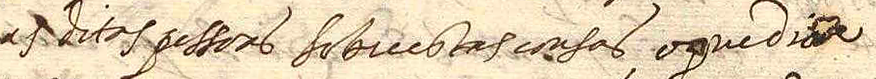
as ditas pessoas sobre estas cousas, o que disse
